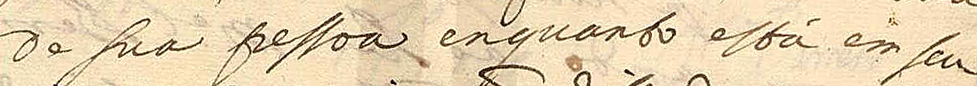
de sua pessoa enquanto está em seu
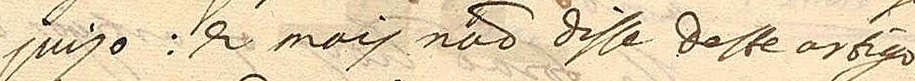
juizo: E mais não disse deste artigo
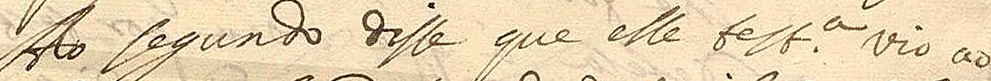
Ao segundo disse que elle test.a vio ao
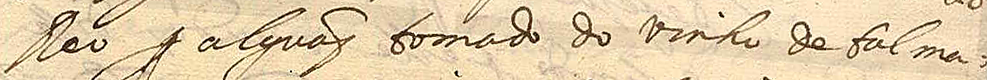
Reo ꝑ algu̅as tomado do vinho de tal ma
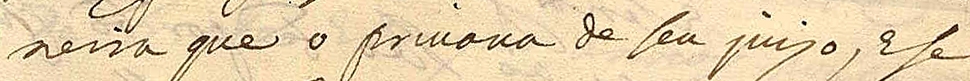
neira que o priuaua de seu juizo, E se
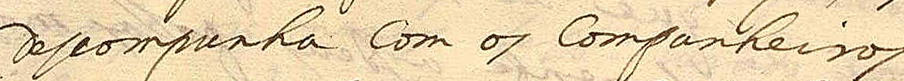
descompunha com os companheiros,
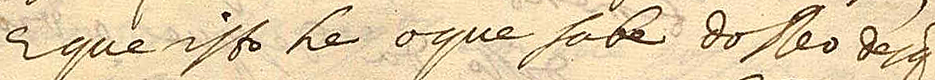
E que isto he o que sabe do Reo des q̅
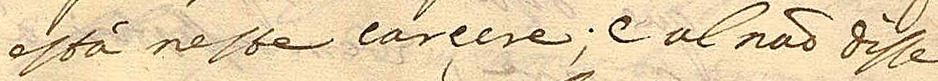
está neste carçere; e al não disse
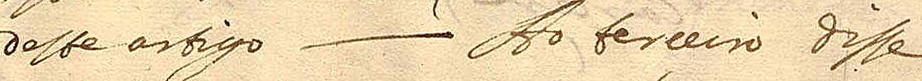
deste artigo - Ao terçeiro disse
